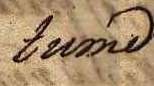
tume
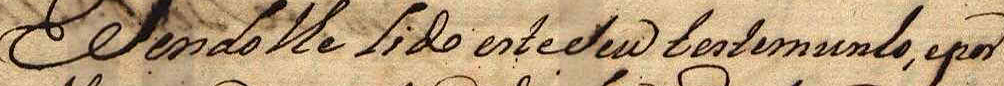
E Sendolhe lido este Seu testemunho, e por
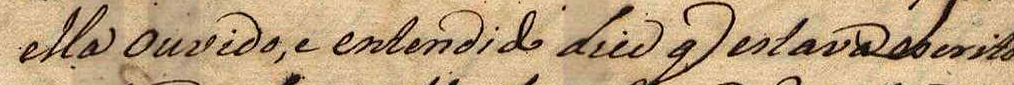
ella ouvido, e entendido dice q̄ estava escrito
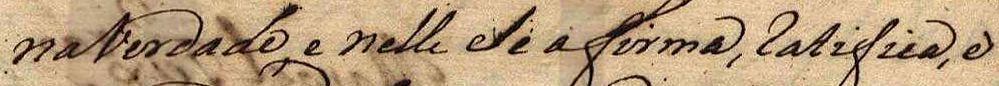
na Verdade, e nelle Se afirma, Ratifica, e
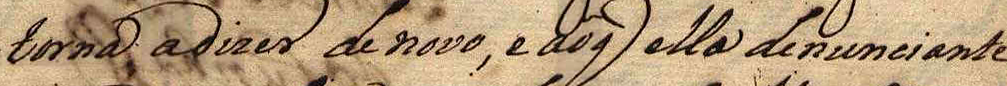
torna a dizer de novo, e ao q̄ ella denunciante
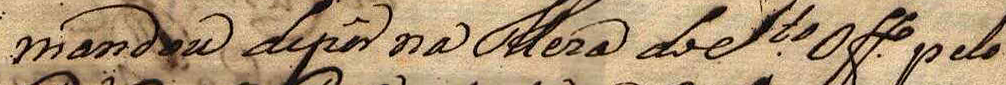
mandou depôr na Meza do S.to Off.o pelo
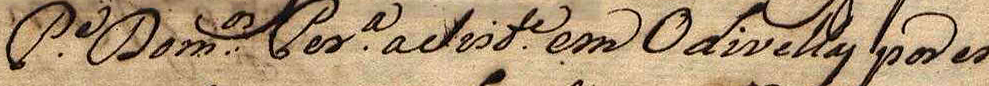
P.e Dom.os Per.a aSist.e em Odivellas por es
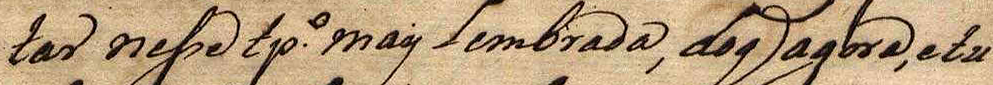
tar nesse tp.o o mais lembrada, do q̄ agora, e tu
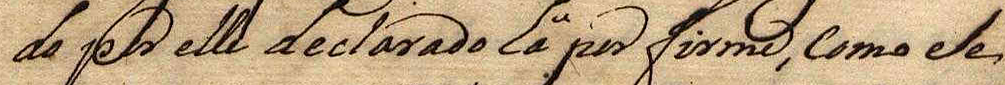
do por elle declarado há por firme, como Se
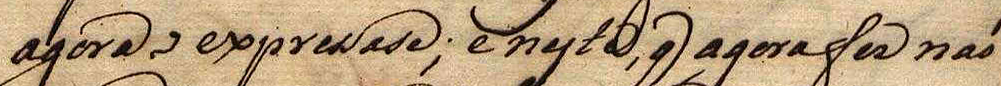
agora o expresase; e nesta, q̄ agora fez naõ
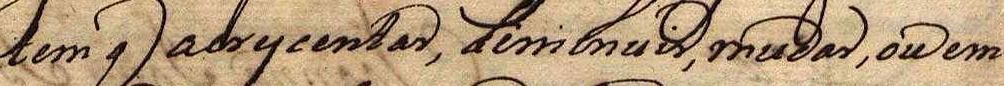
tem q̄ acrescentar, diminuir, mudar, ou em
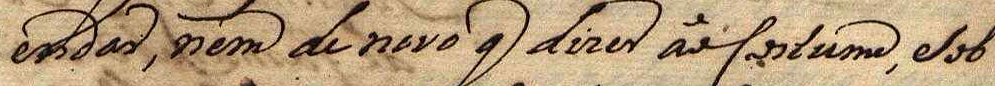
endar, nem de novo q̄ dizer âo Costume, Sob
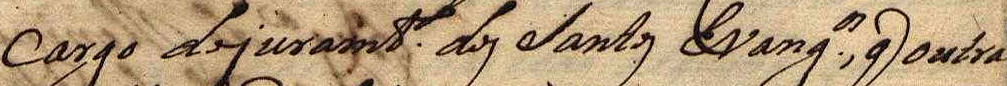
cargo do jurament.o dos Santos Evang.os, q̄ outra
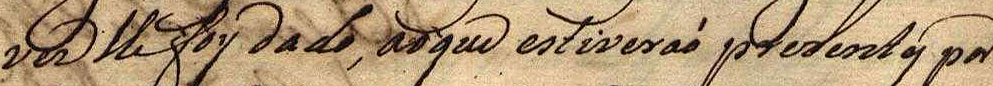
vez lhe foy dado, ao que estiveraõ prezentes, por
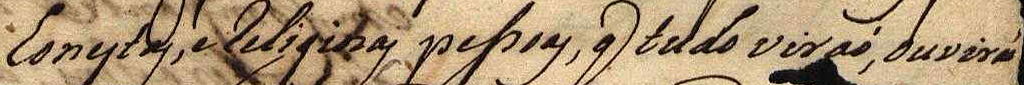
honestas, e Religiozas pessoas, q̄ tudo viraõ, ouviraõ
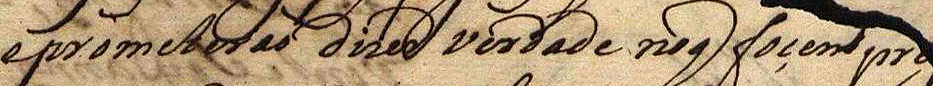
e prometeraõ dizer verdade no q̄ foçem pre
